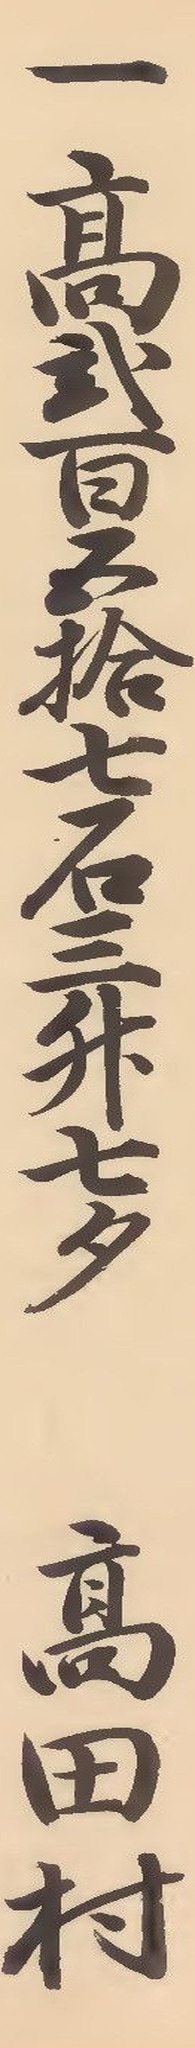一高弐百五拾七石三升七勺高田村
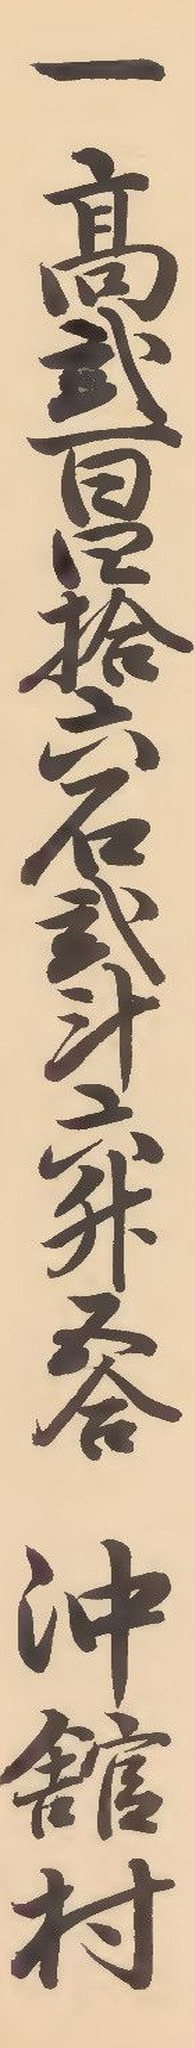一高弐百四拾六石弐斗六升五合沖館村

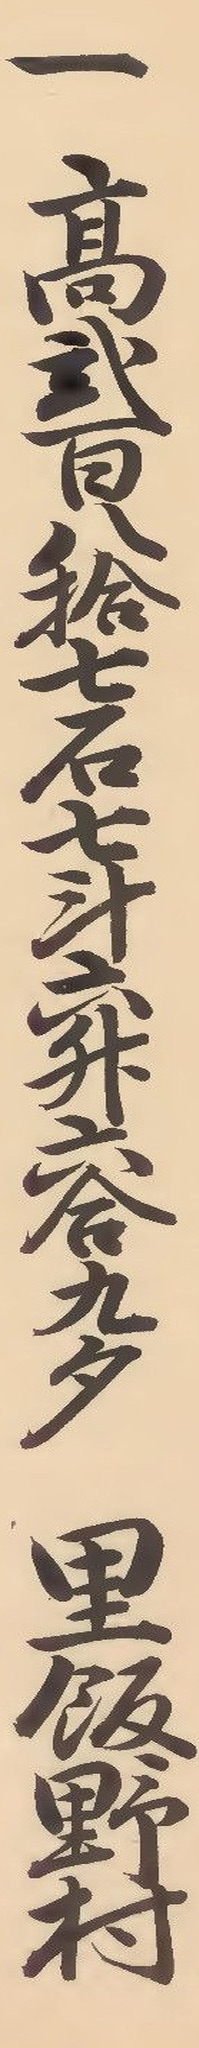一高弐百八拾七石七斗六升六合九勺里飯野村
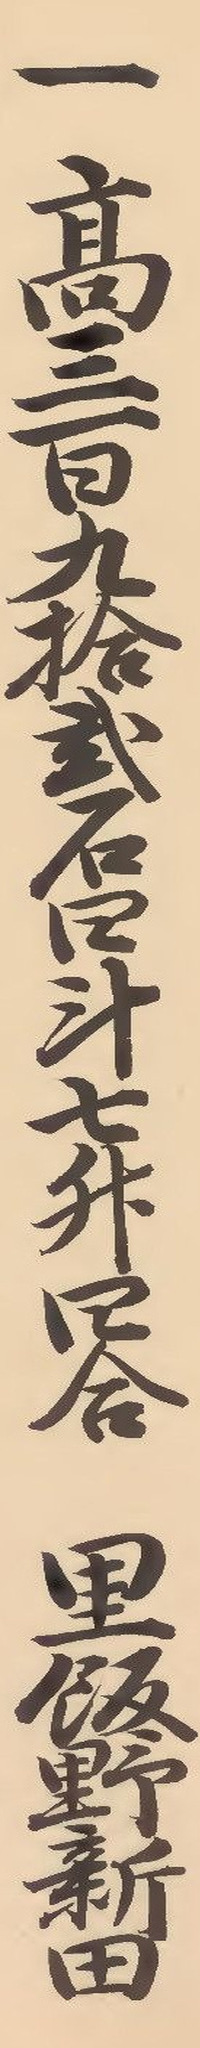一高三百九拾弐石四斗七升四合里飯野新田
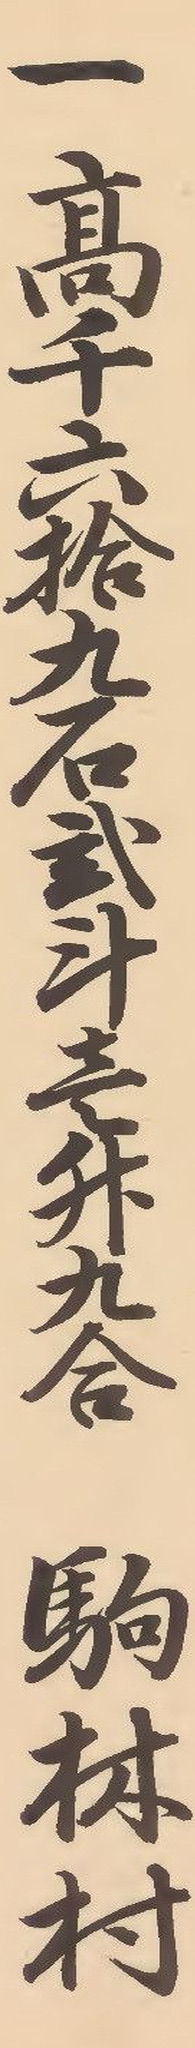一高千六拾九石弐斗壱升九合駒林村
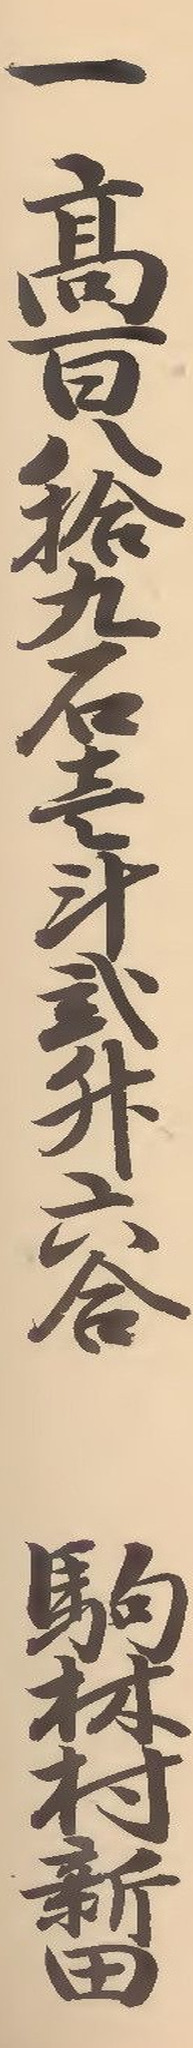一高百八拾九石壱斗弐升六合駒林村新田
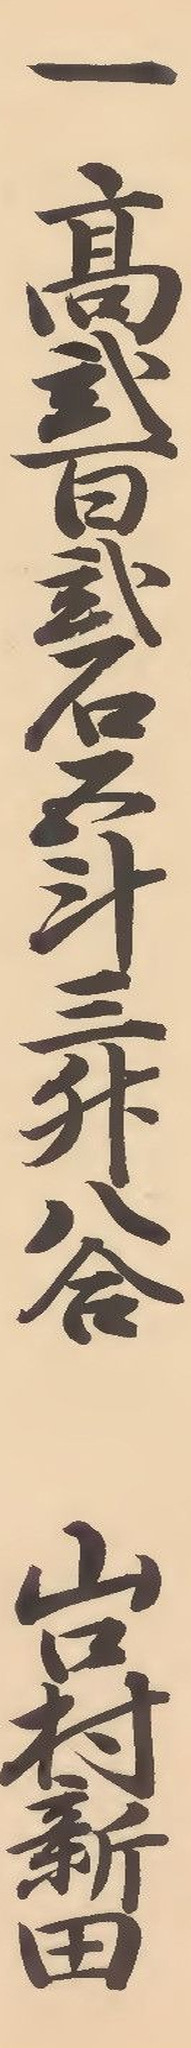一高弐百弐石五斗三升八合山口村新田
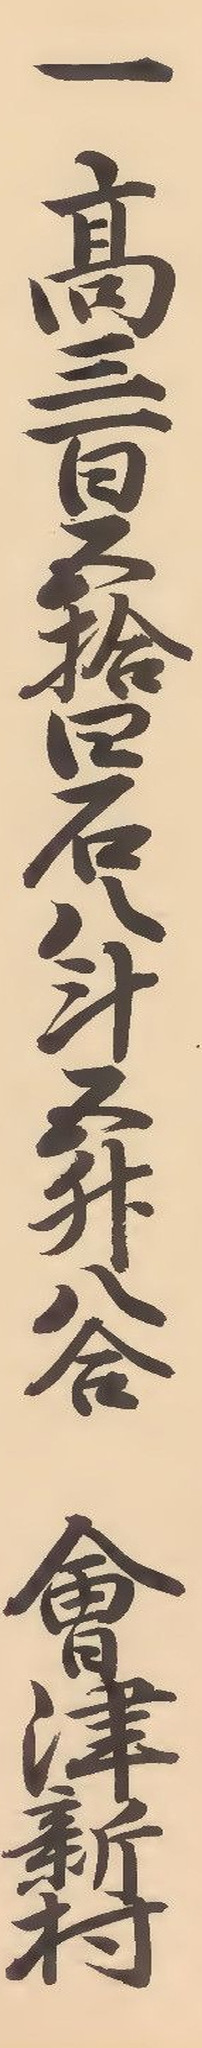一高三百五拾四石八斗五升八合会津新村

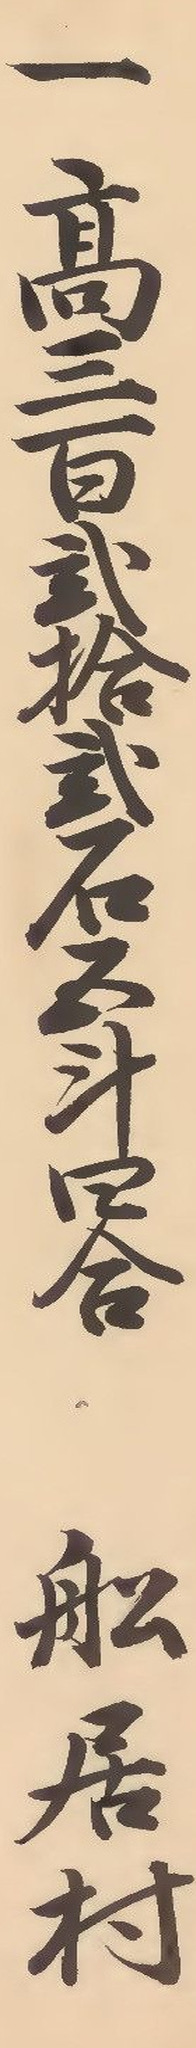一高三百弐拾弐石五斗四合船居村
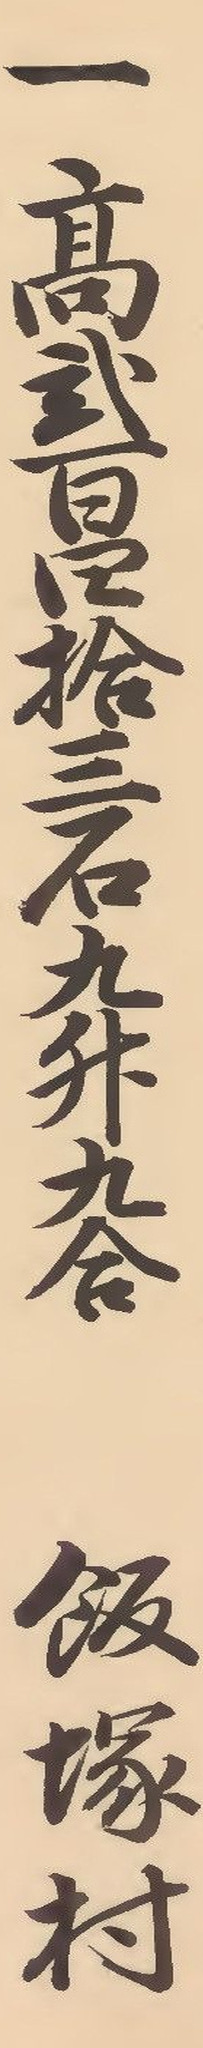一高弐百四拾三石九升九合飯塚村
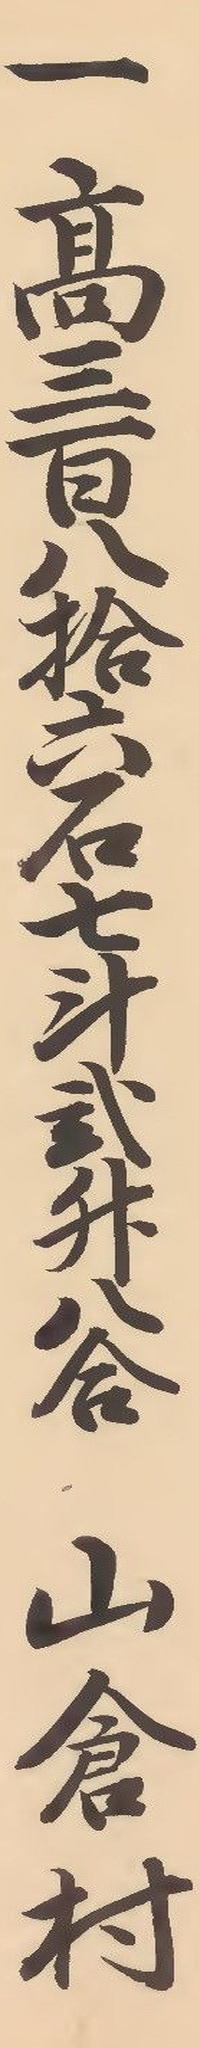一高三百八拾六石七斗弐升八合山倉村
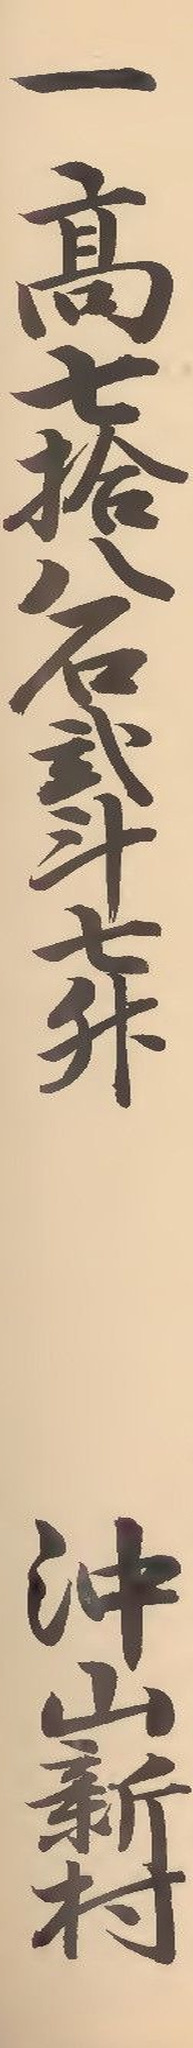一高七拾八石弐斗七升沖山新村
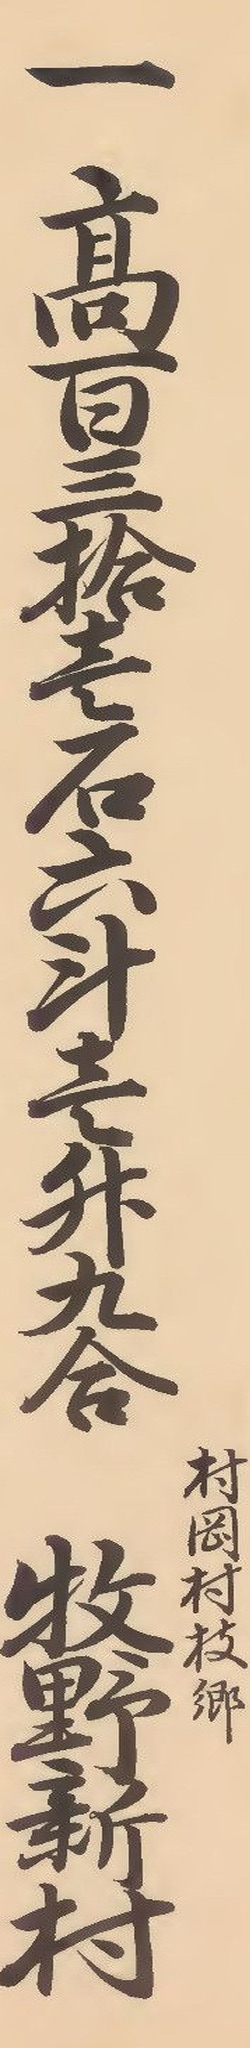一高百三拾壱石六斗壱升九合牧野新村
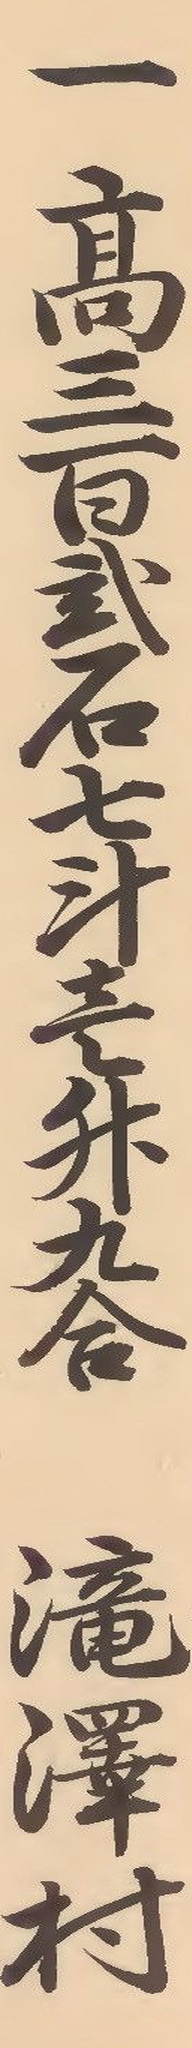一高三百弐石七斗壱升九合滝沢村
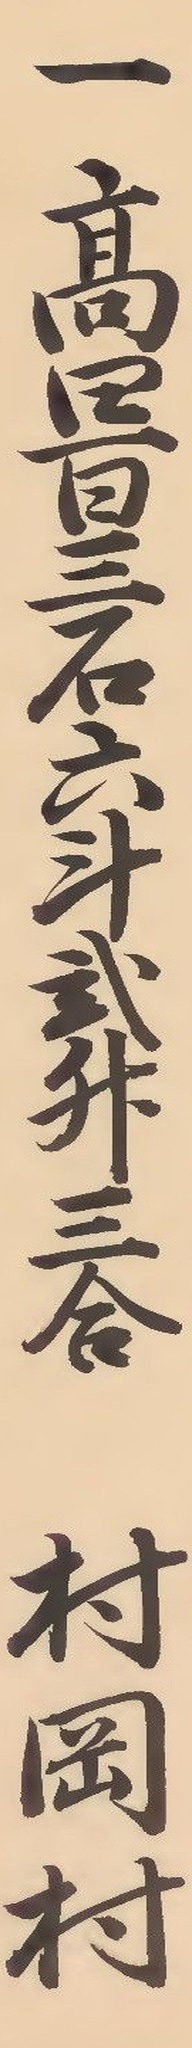一高四百三石六斗弐升三合村岡村

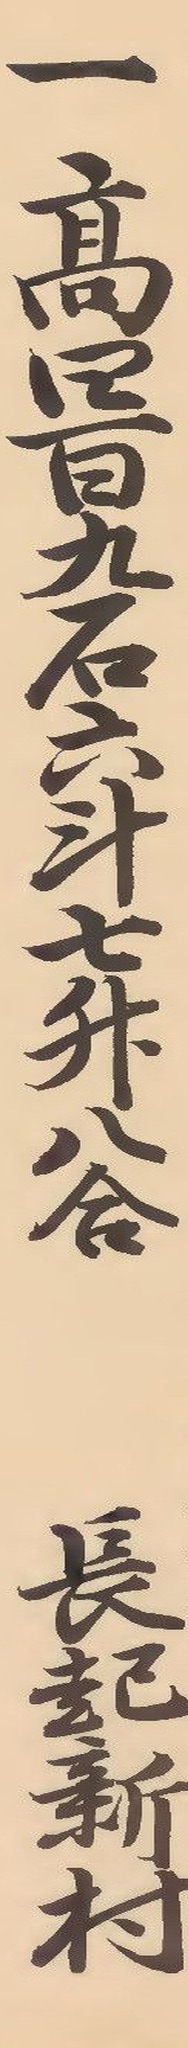一高四百九石六斗七升八合長起新村
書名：越後国郷帳　下
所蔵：国立公文書館 National Archives of Japan
